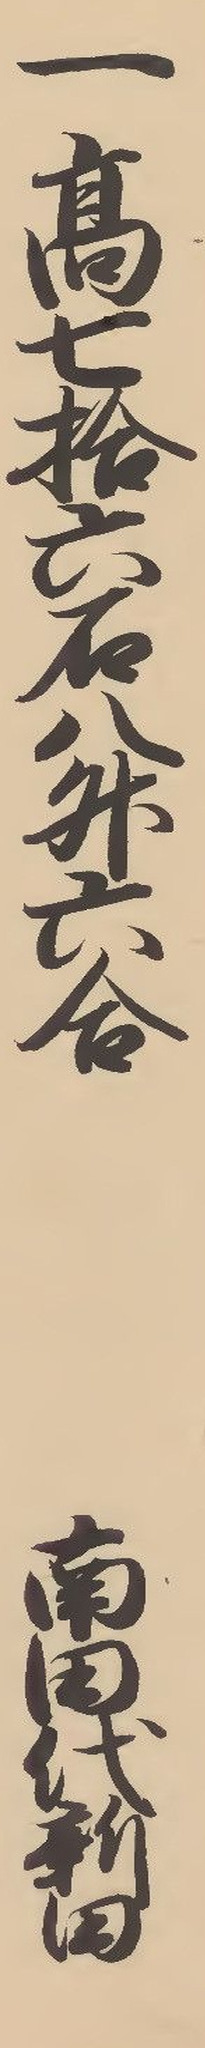一高七拾六石八升六合南田代新田
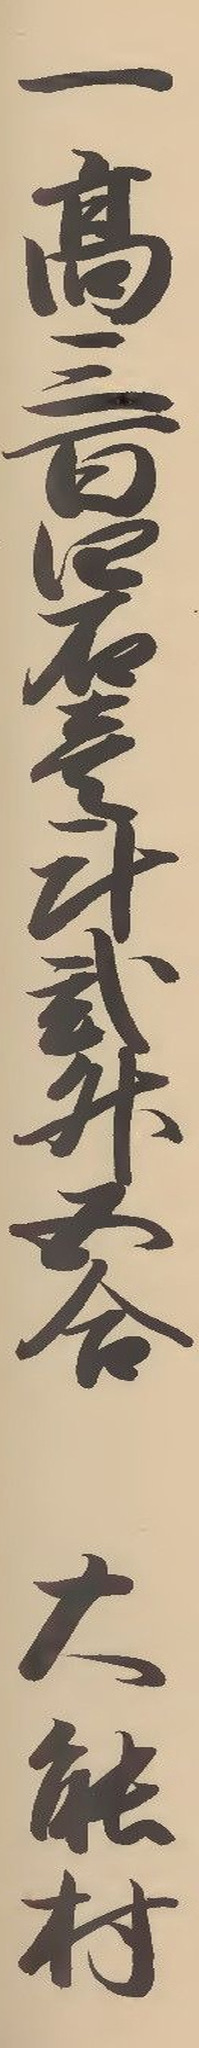一高三百四石壱斗弐升五合大能村
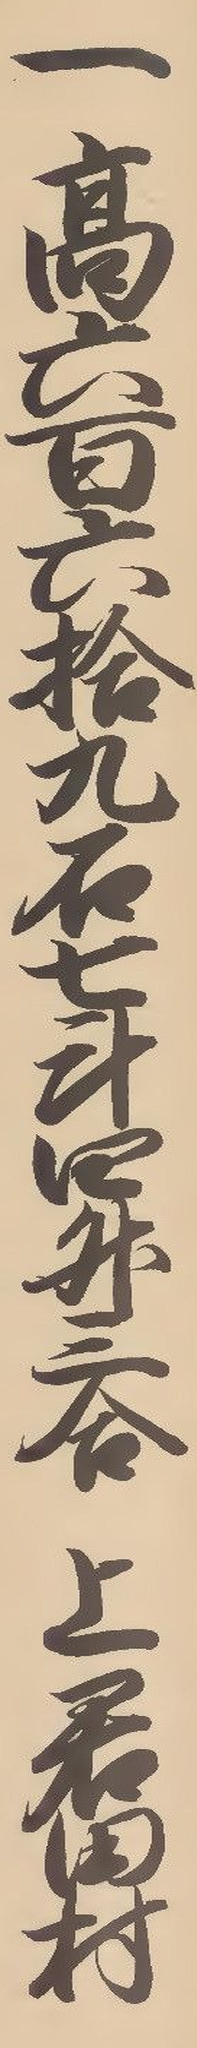一高六百六拾九石七斗四升三合上君田村
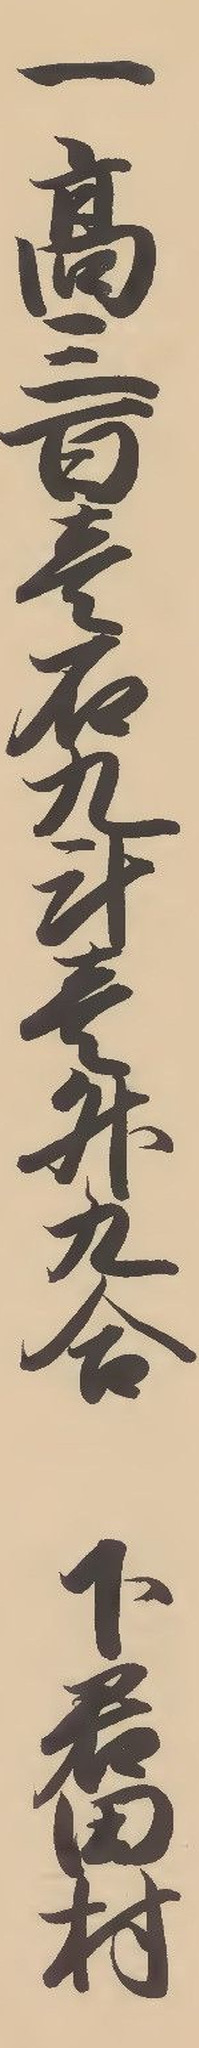一高三百壱石九斗壱升九合下君田村
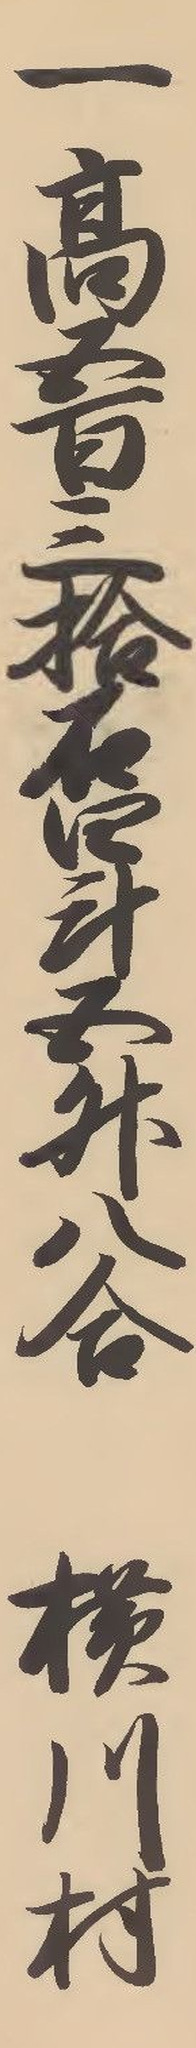一高五百三拾石四斗五升八合横川村
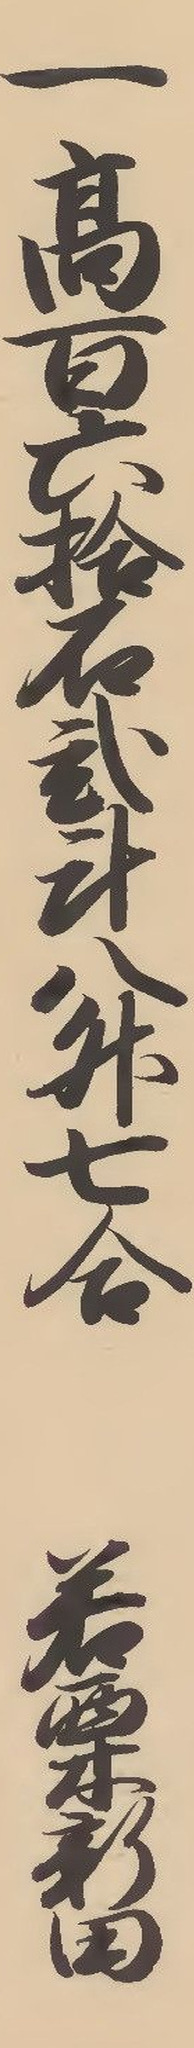一高百六拾石弐斗八升七合若栗新田

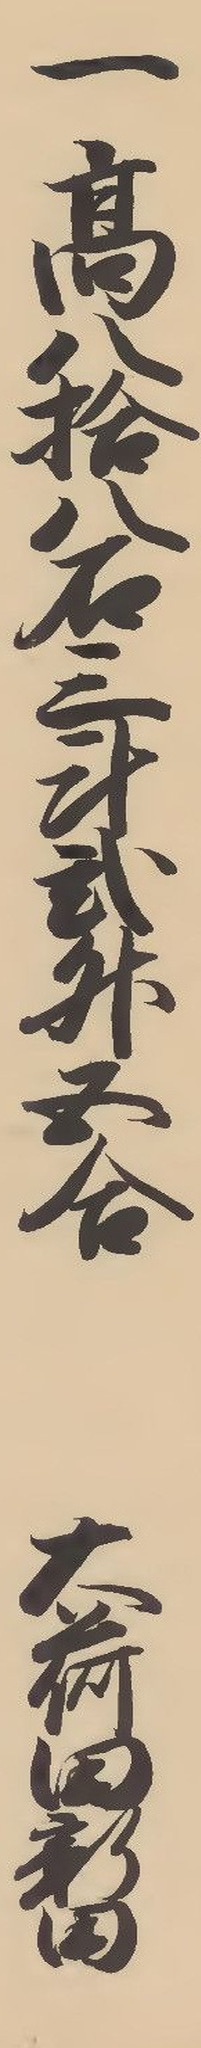一高八拾八石三斗弐升五合大荷田新田
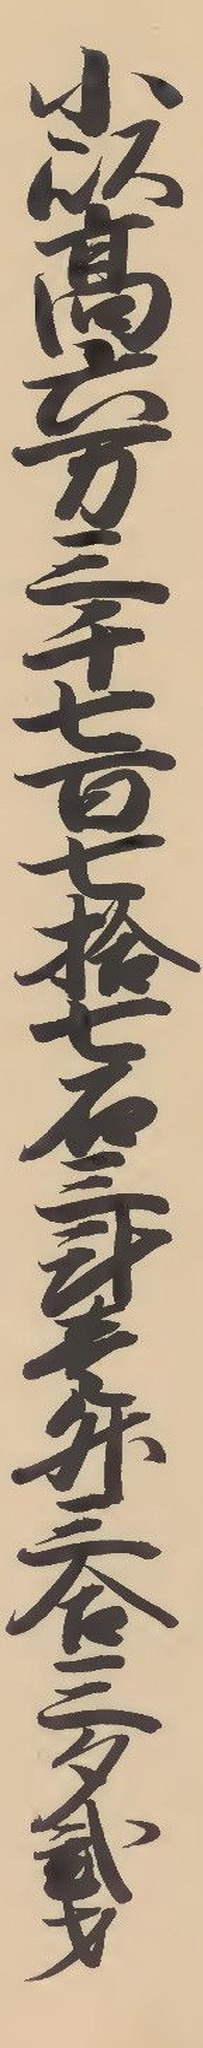小以高六万三千七百七拾七石三斗壱升三合三勺弐才
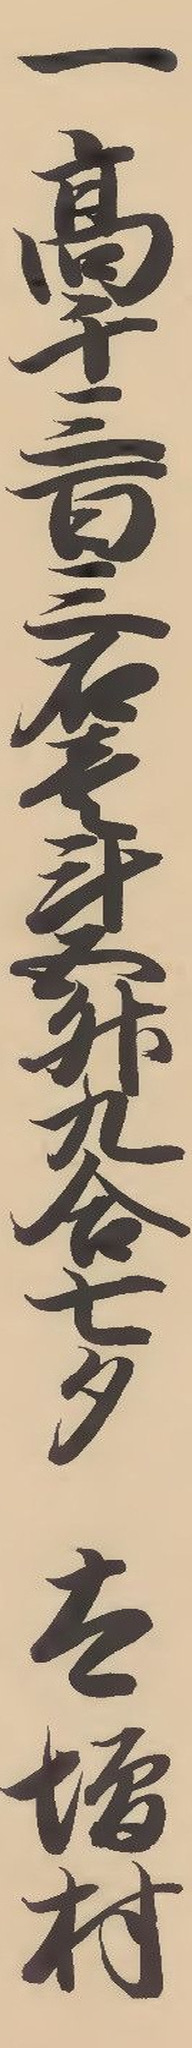一高千三百三石壱斗五升九合七勺太増村
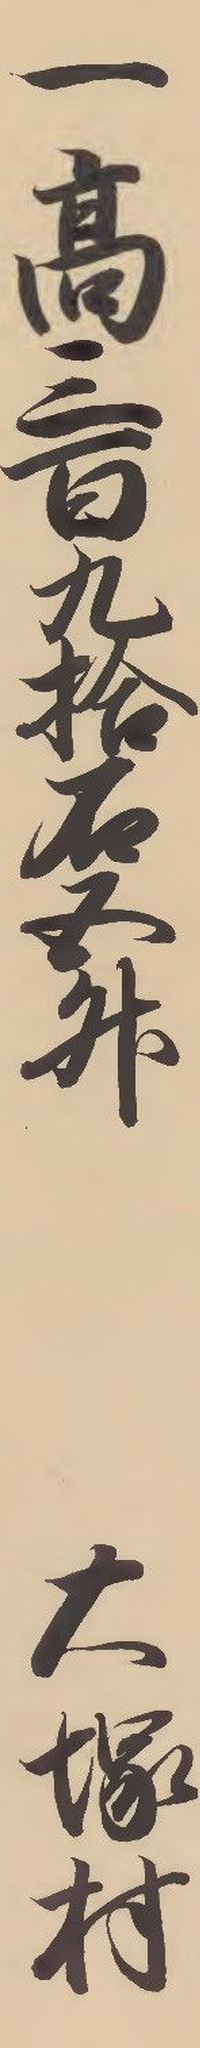一高三百九拾石五升大塚村
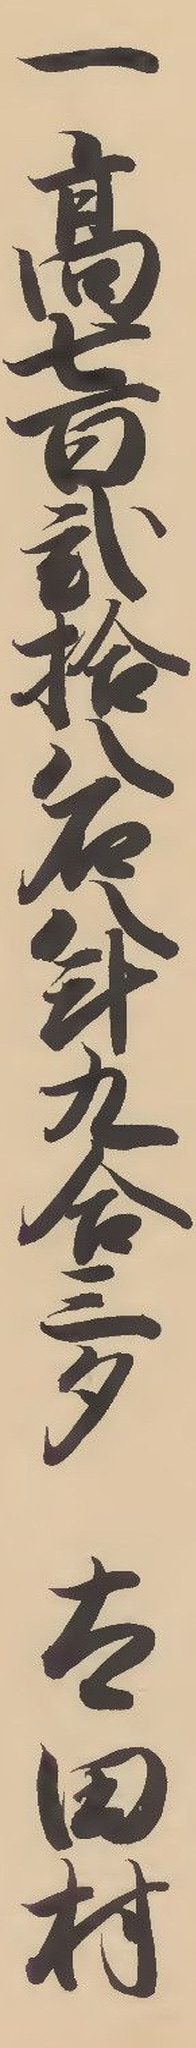一高七百弐拾八石八斗九合三勺太田村

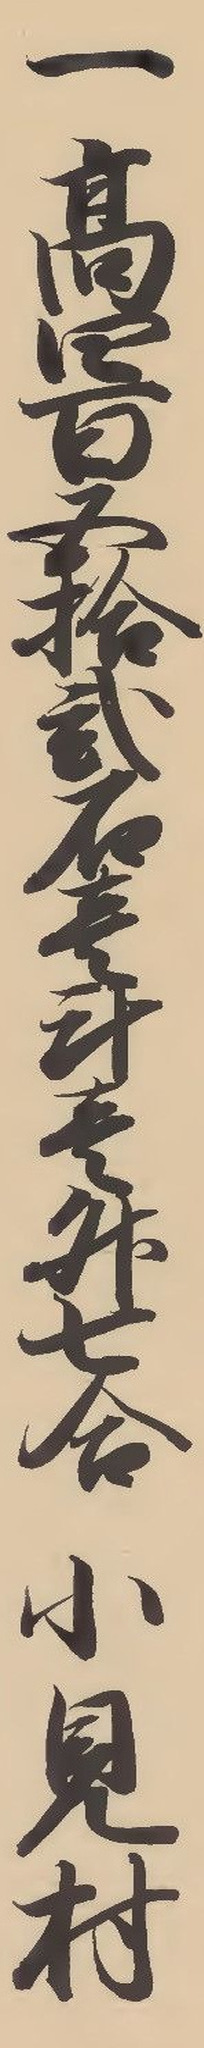一高四百五拾弐石壱斗壱升七合小見村
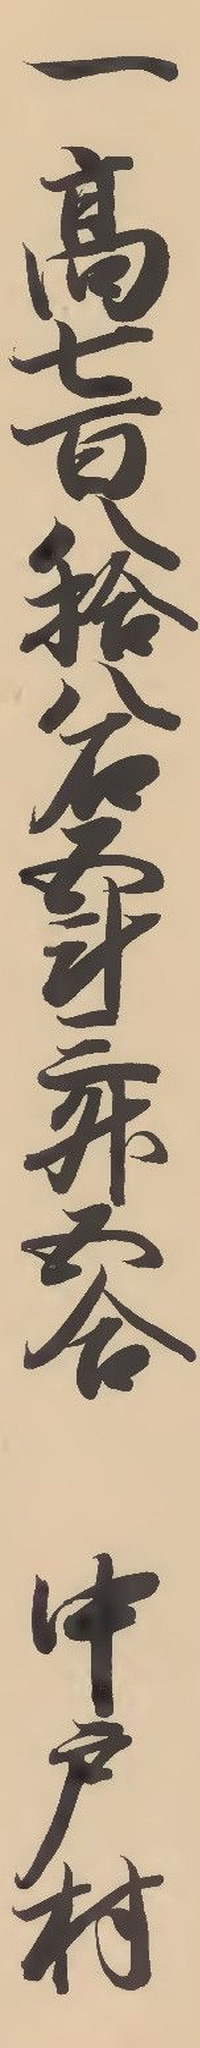一高七百八拾八石五斗三升五合中戸村
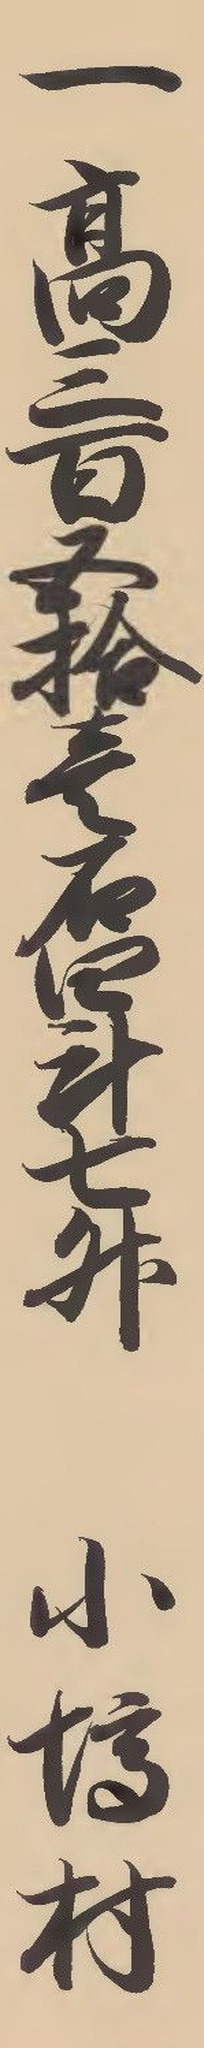一高三百五拾壱石四斗七升小塙村
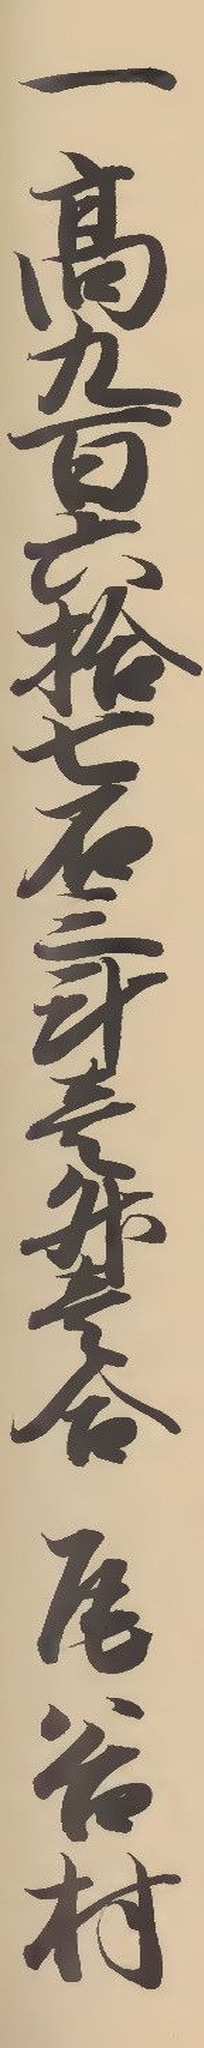一高九百六拾七石三斗壱升壱合瓦谷村
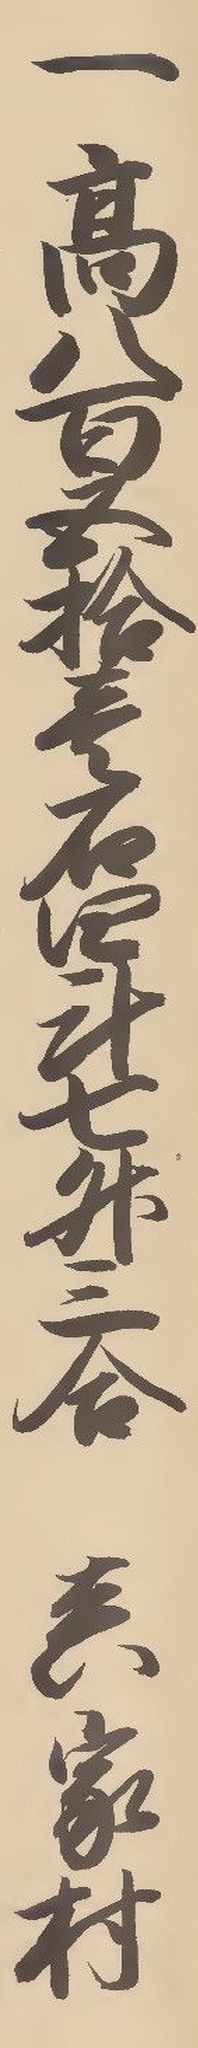一高八百五拾壱石四斗七升三合真家村
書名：常陸国郷帳
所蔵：国立公文書館 National Archives of Japan
